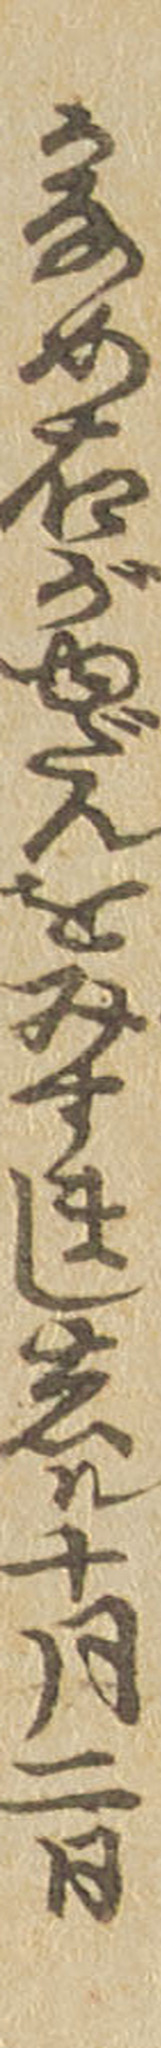かなめ石がゆだんをみすまし去る十月二日
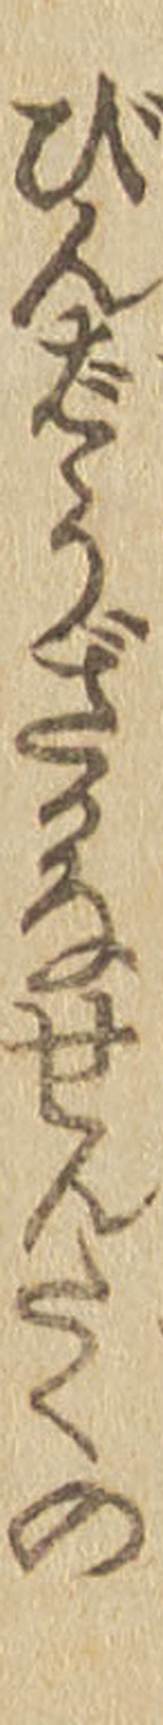びんばうざかなせんたくの
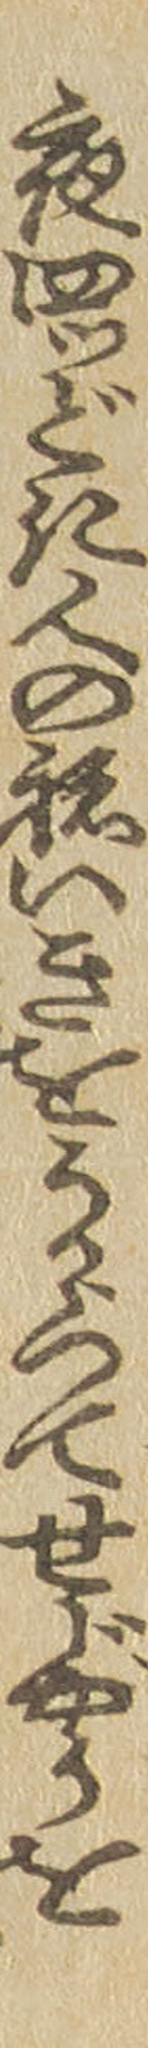夜四っどき人のねいきをうかゞつてせじやうを
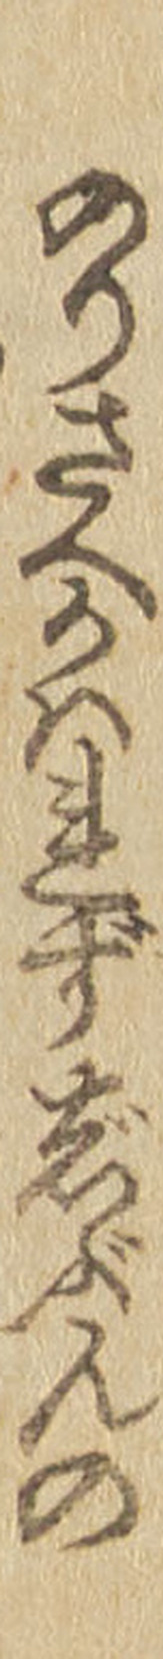のりさへかはれずじぶんの
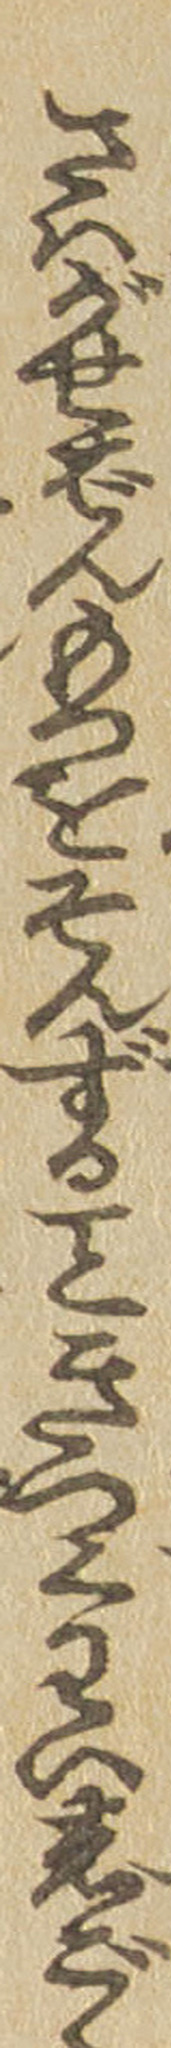さはがせばんもつをそんずることきつくわいしごく
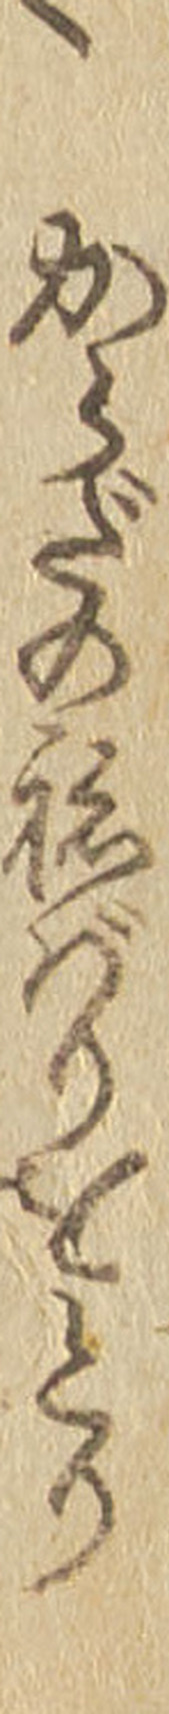からだのねばりをとり
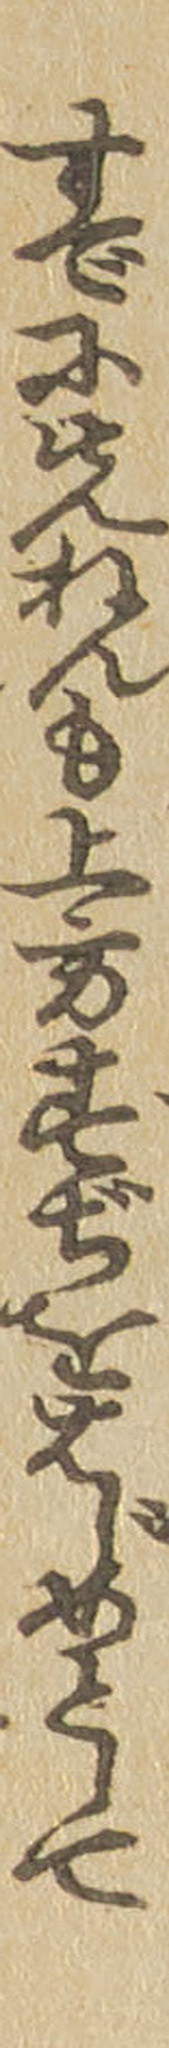すでに先ねんも上方すぢをはじめとして
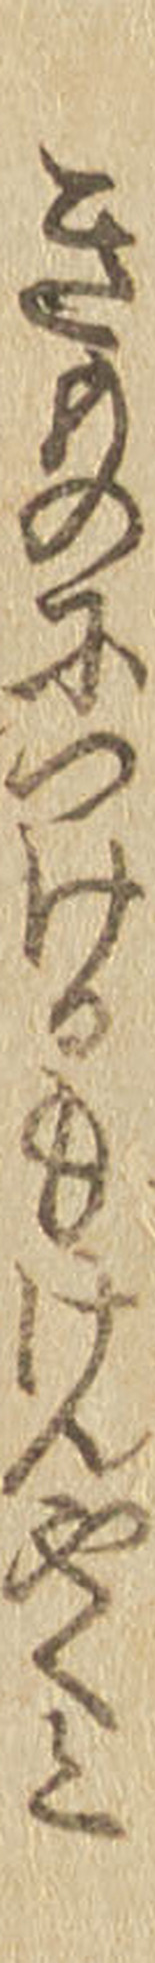きものにつけるもけんやくと
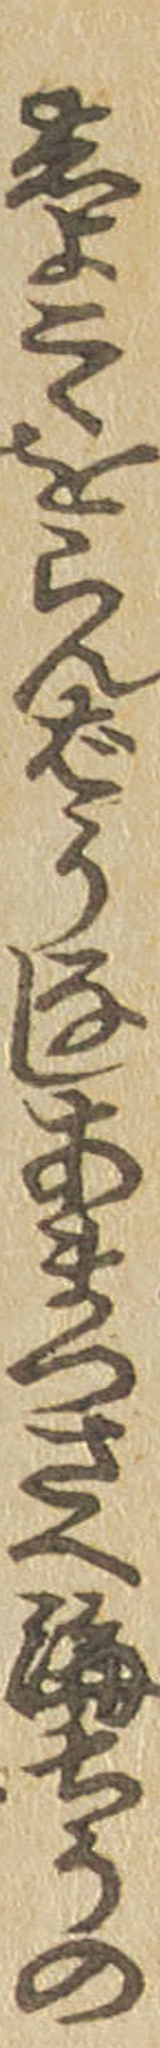しよこくをらんばうなしあまつさへ海ちうの
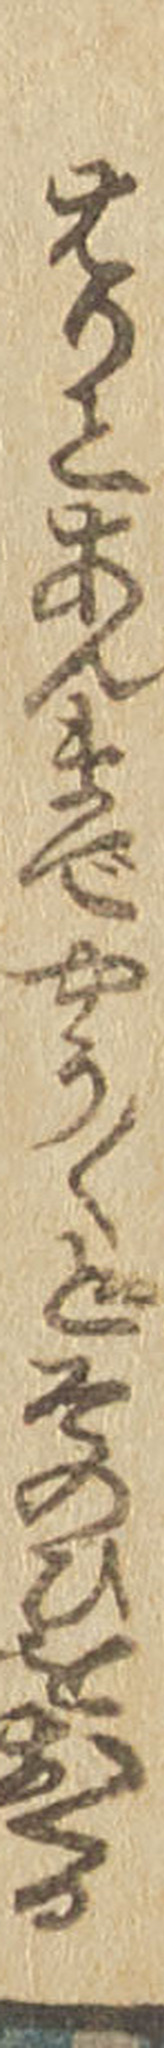はりとあんまでやう〳〵とそのひをおくる
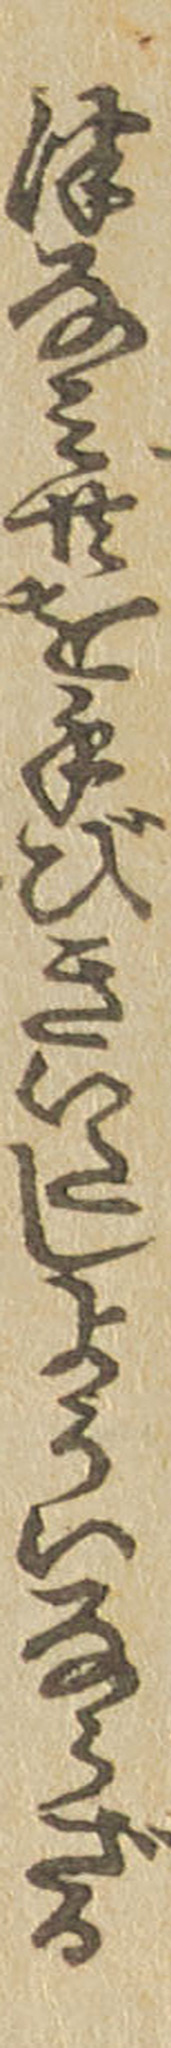津なみ共を手びきいたしよういならざる
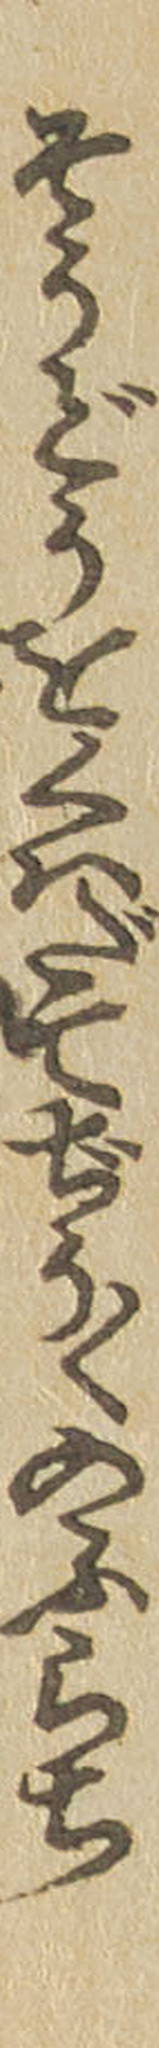そうどうをくはだてぢう〳〵のふらち
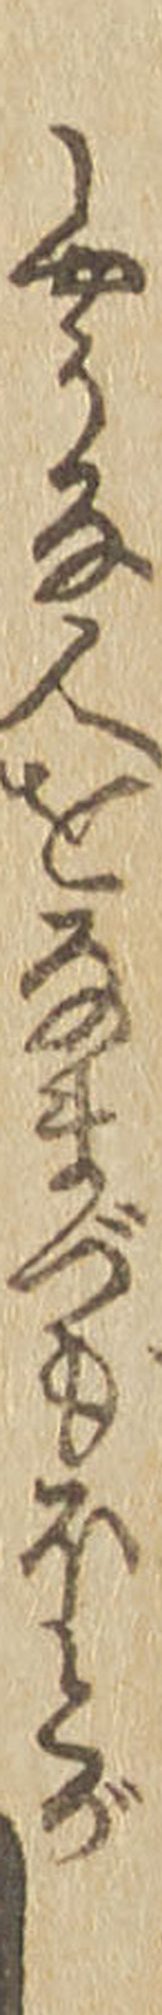しやうな人をなまづもほとが
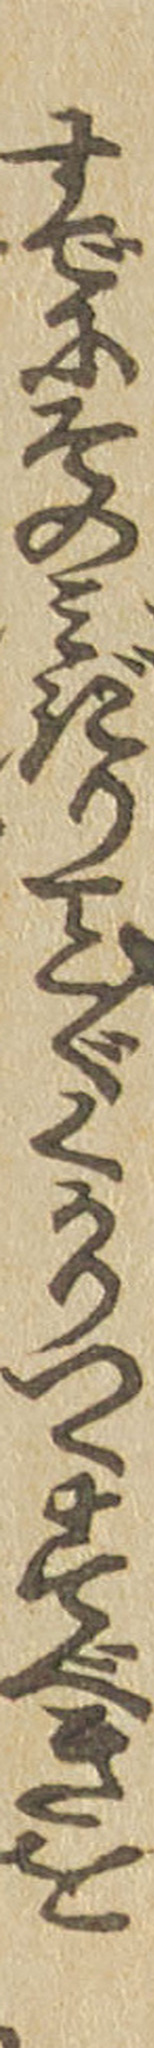すでにそのみぎりこと〴〵くかりつくすべきを
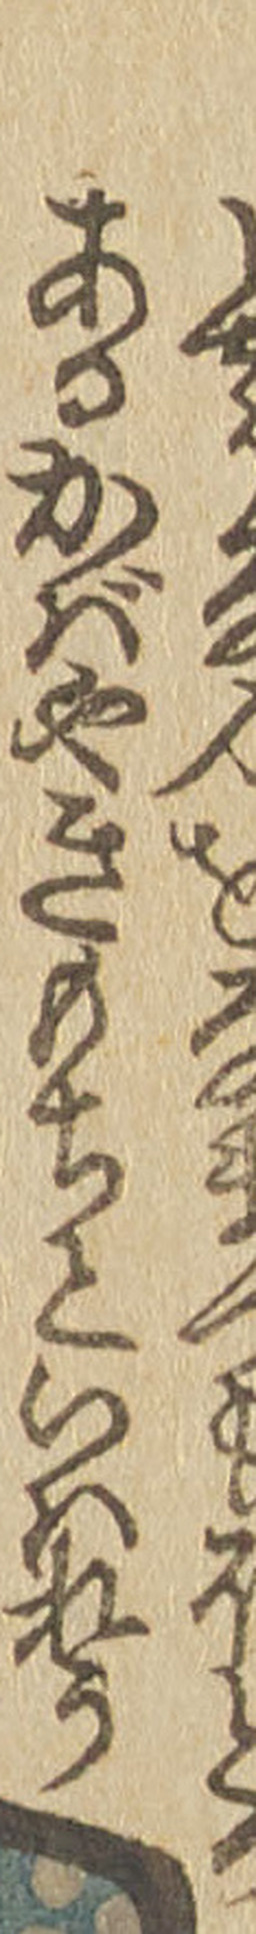あるかばやきもちといわれう
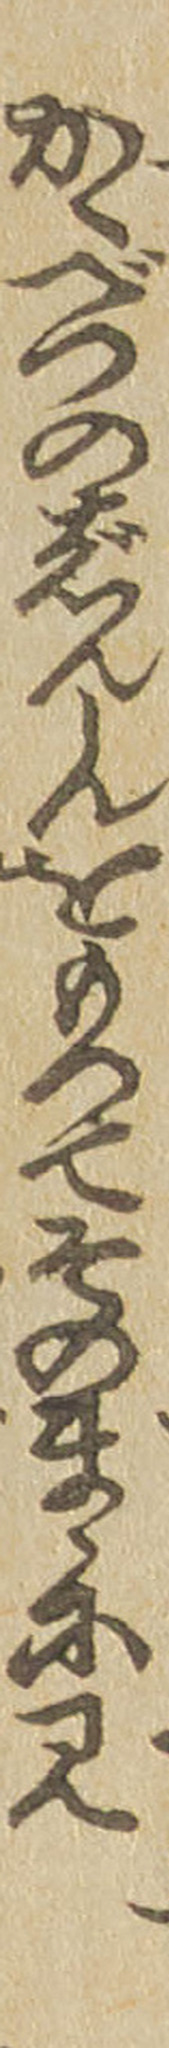かくべつのじんしんをもつてそのまゝに見
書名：地震太平記
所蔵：東京大学総合図書館 General Library in the University of Tokyo, JAPAN
